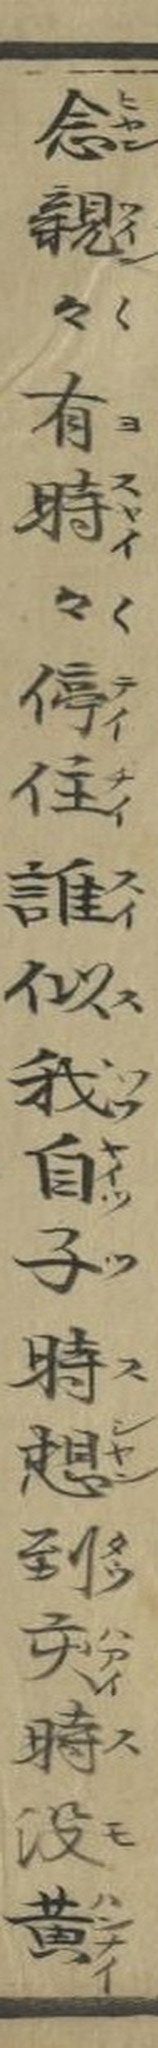念親々有時々停住誰似我自子時想到時没黄

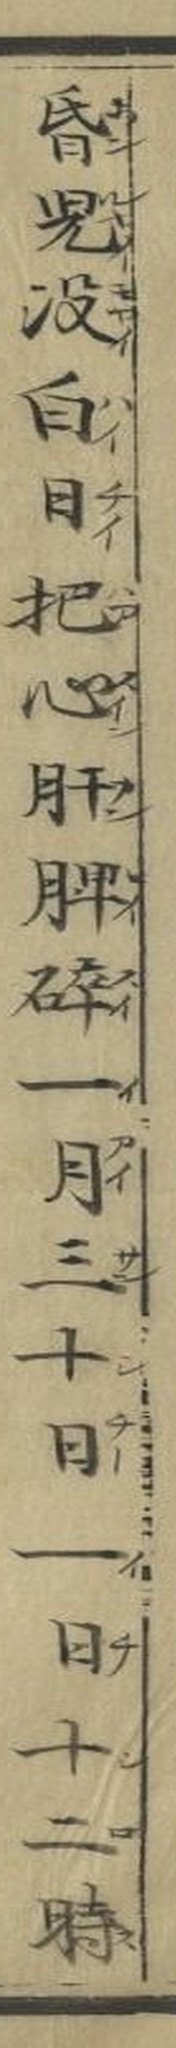昏児没白日杷心肝脾碎一月三十日一日十二時
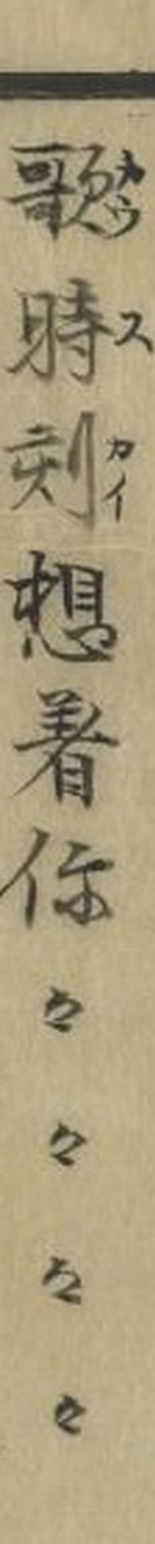歌時想着你々々々々
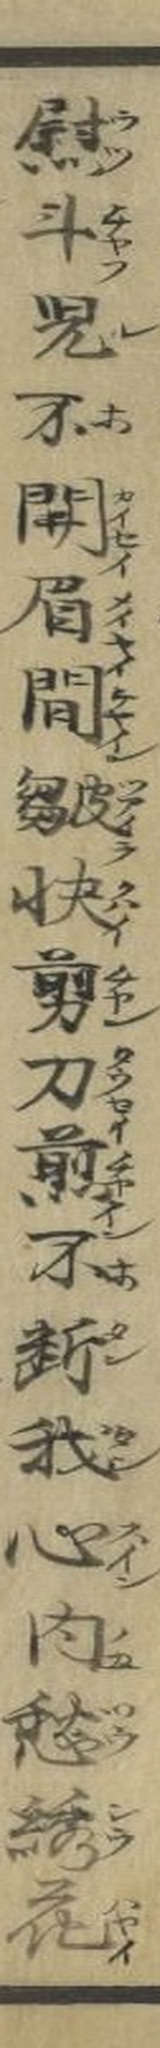慰斗児不開眉間皺快剪刀剪不断我心内愁綉花
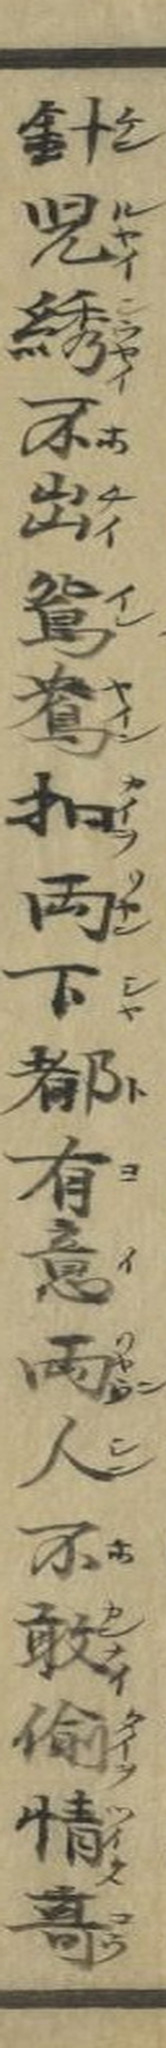針児綉不出鴛鴦扣両下都有意両人不敢偸情哥
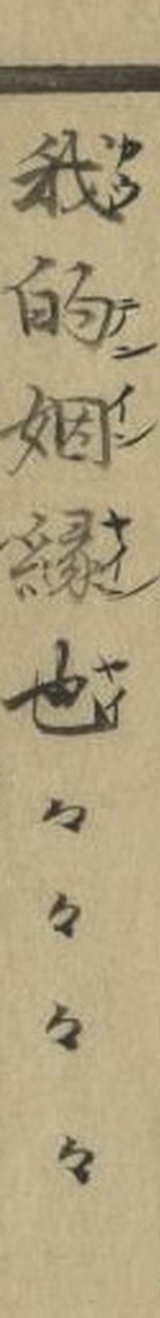我的姻縁也々々々々
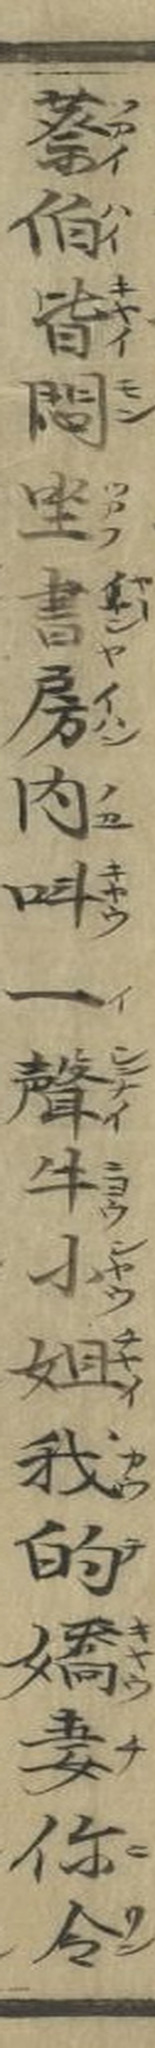葵伯皆問坐書房内叫一聲牛小姐我的嬌妻你令
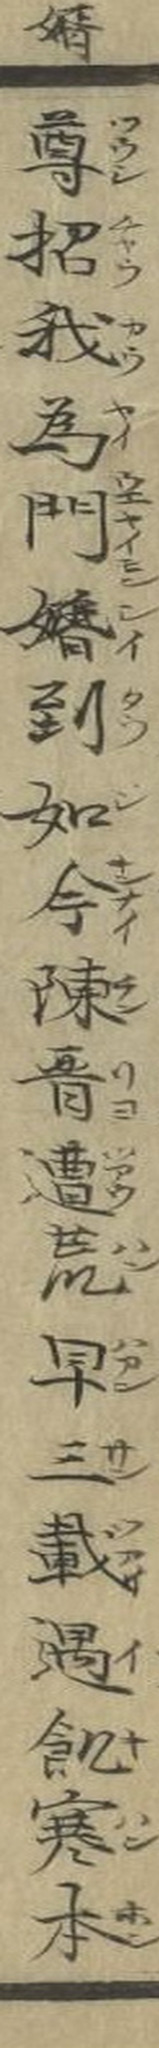尊招我為門到如今陳普遭荒早三載遇飢寒本
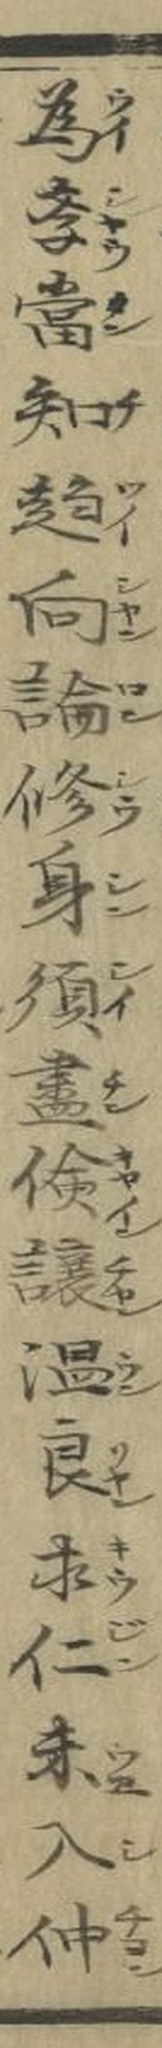為斈當知向論修身須盡譲温良求仁未仲
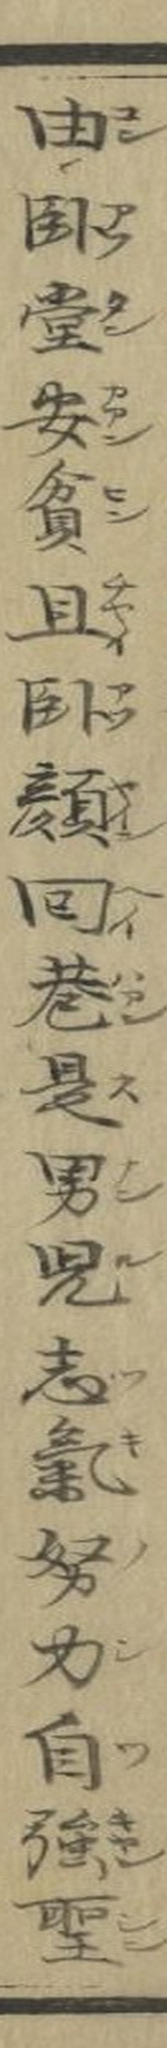由堂安貧且臥顔囘巷是男児志氣努力自強聖
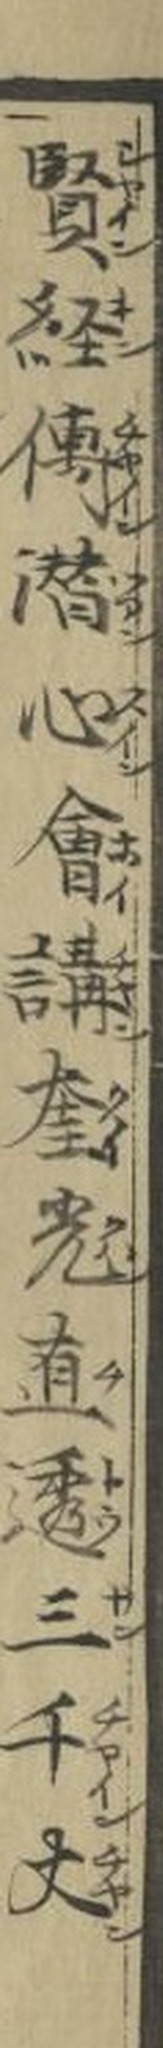賢経傳潜心會講奎光直透三千丈
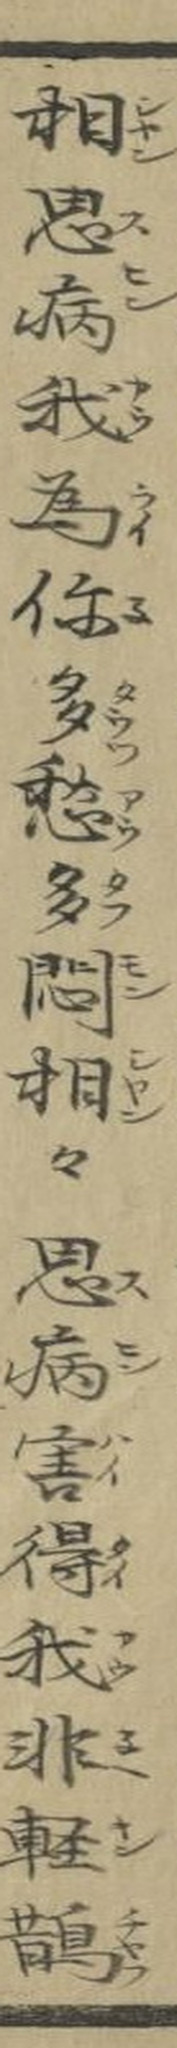相思病我為你多愁多悶相々思病害得我非軽鵲
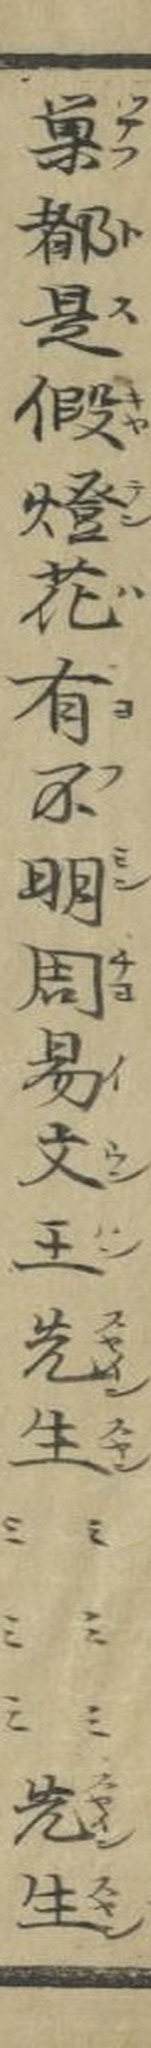巣都是假燈花有不明周王先生先生
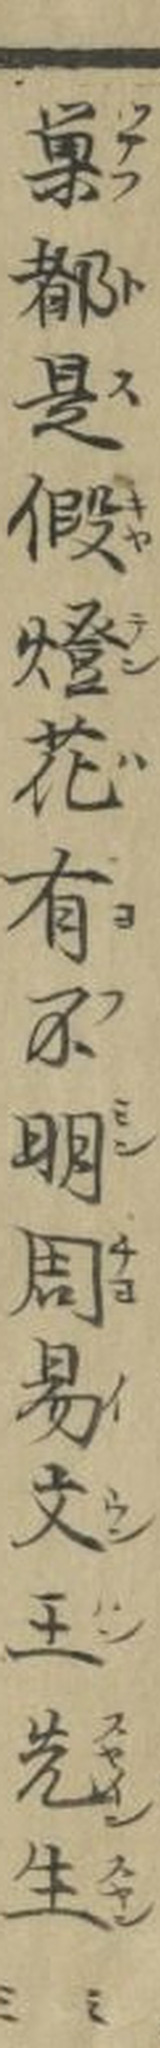巣都是假燈花有不明周王先生先生
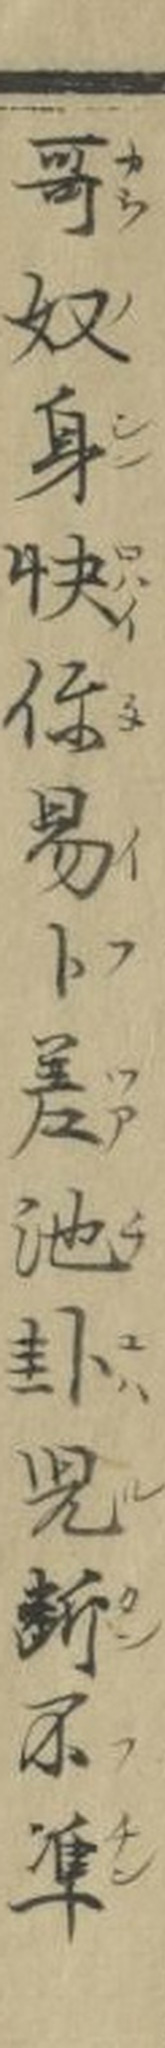哥奴身快你易卜差池卦児断不準
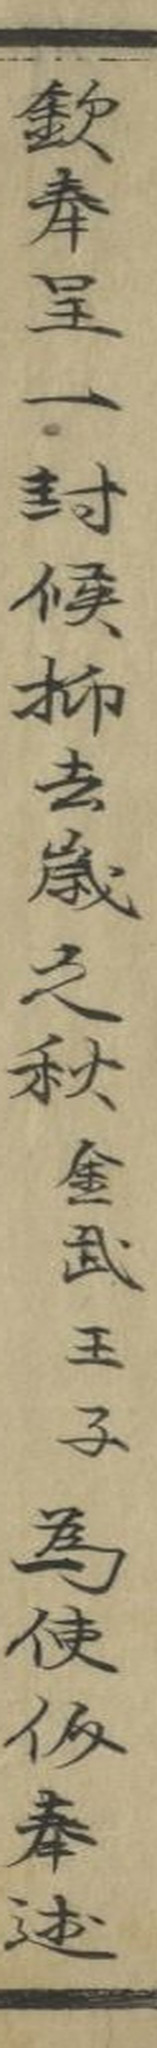欽奉呈一封候抑去歳之秋金武王子為使价奉述
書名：琉球往来（下）
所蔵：University of the Ryukyus Library
